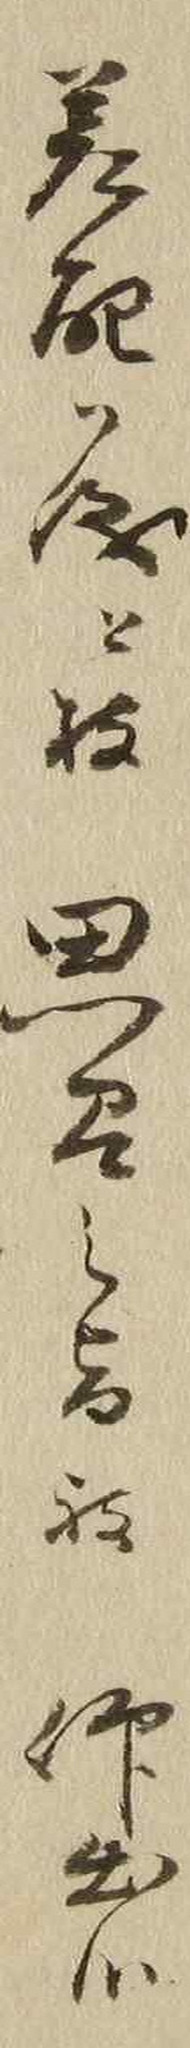差配候儀と被思召之旨被仰出候
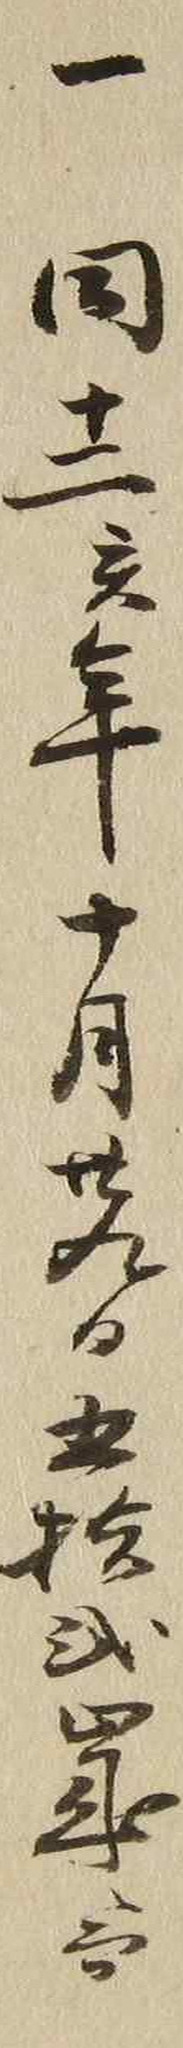一同十二亥年十月廿九日五拾弐歳ニ而
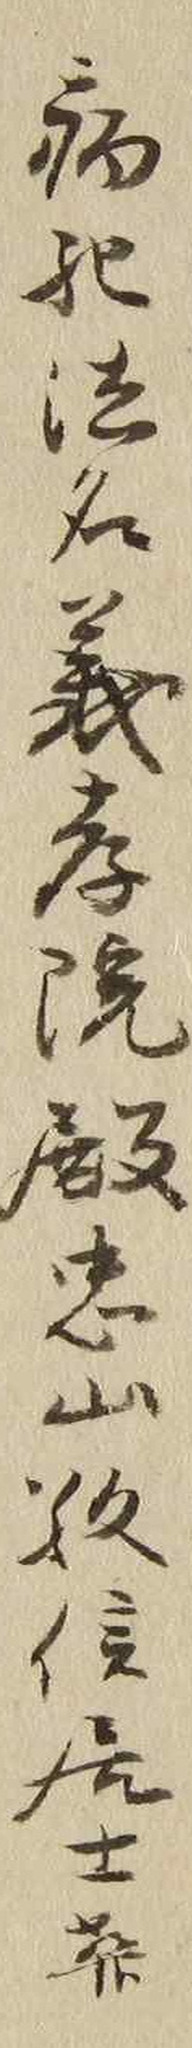病死法名義孝院殿忠山敬信居士葬
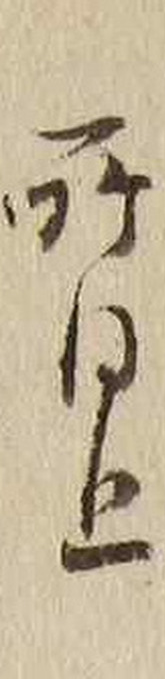所同上
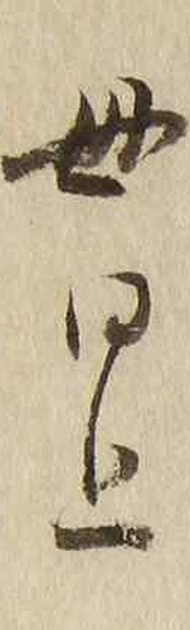所同上

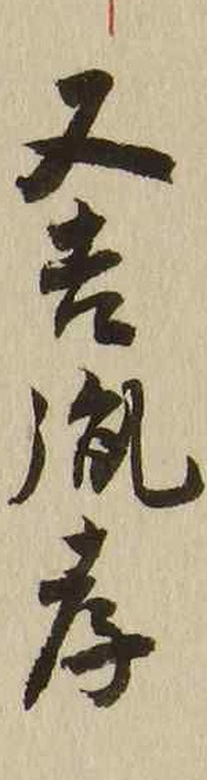又吉胤孝
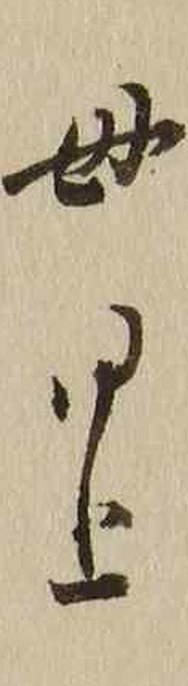母同上
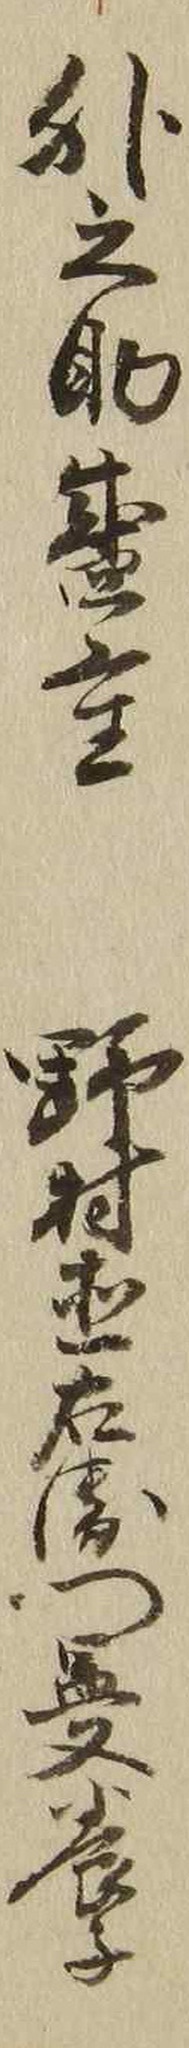外之助盛重野村直右衛門曼養子
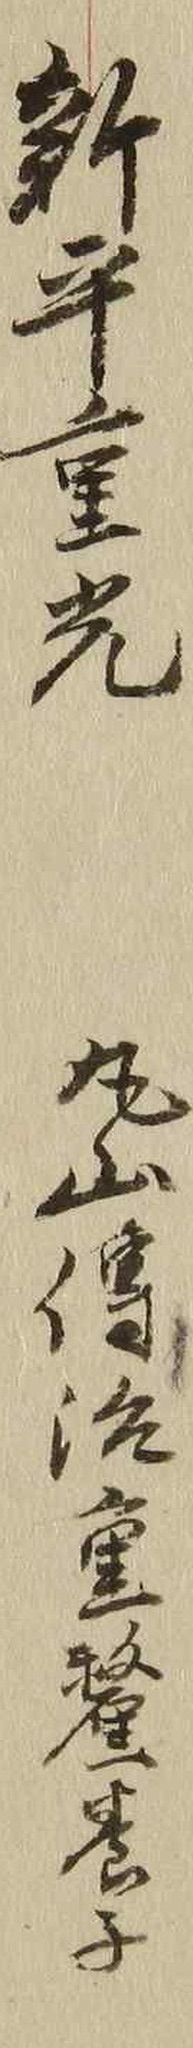新平重光丸山伝治重釐養子
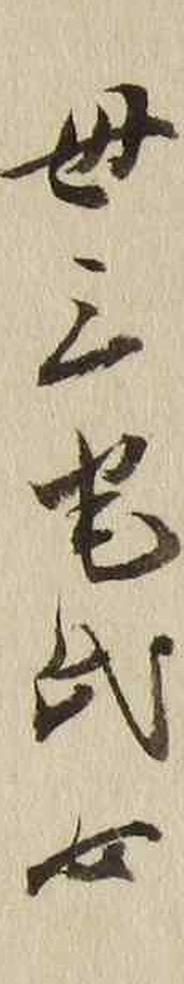母三宅氏女
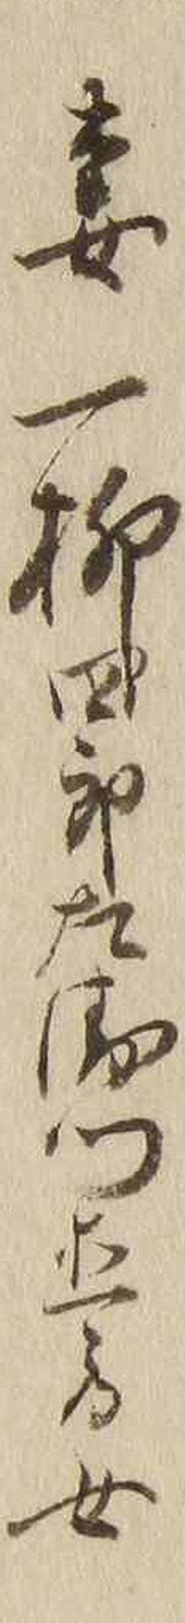妻一柳四郎左衛門直方女
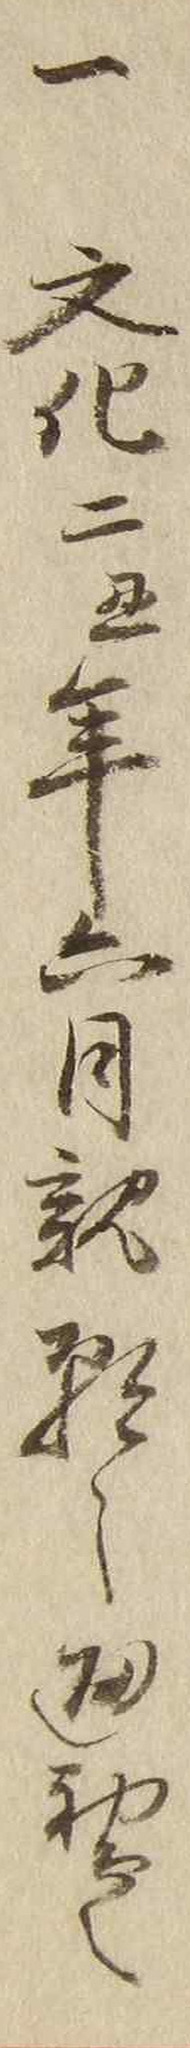一文化二丑年六月親願之通初而之

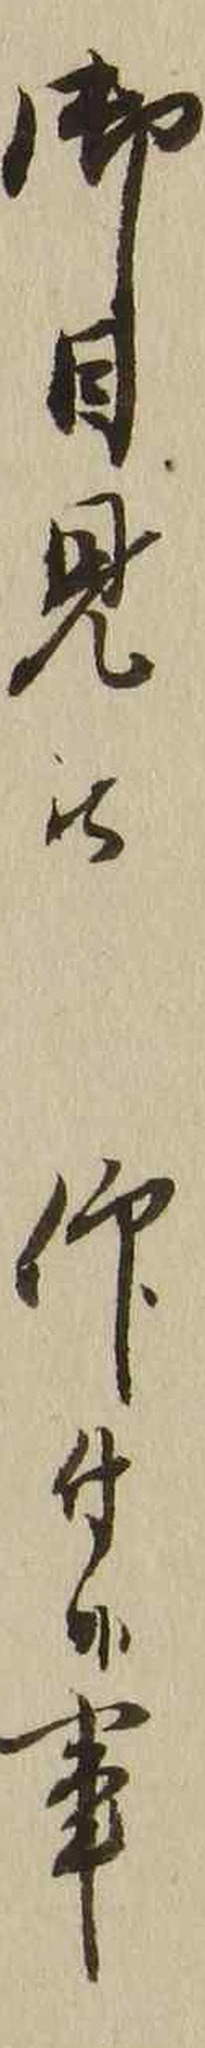御目見被仰付候事
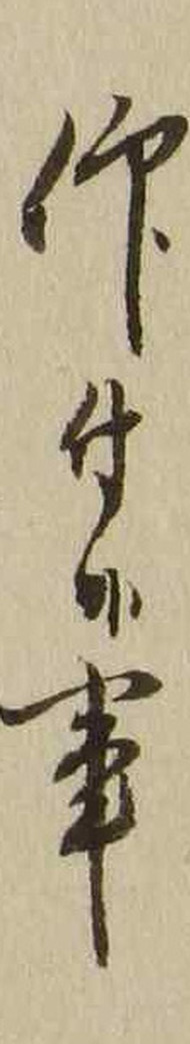仰付候事
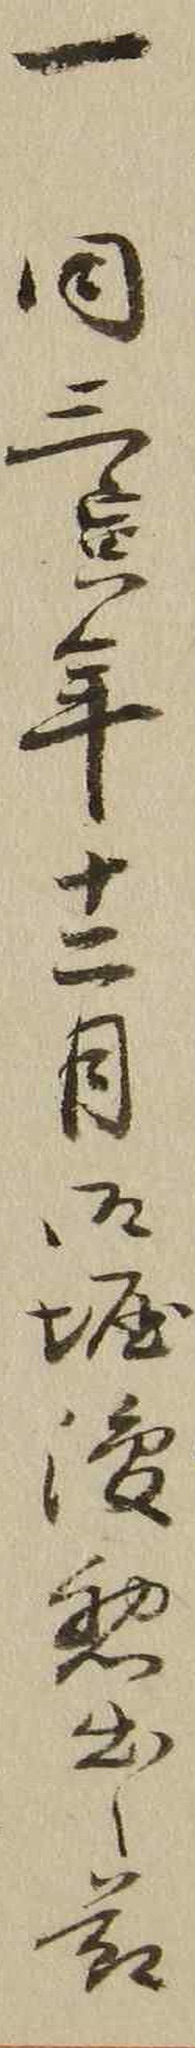一同三寅年十二月御堀浚惣出候節
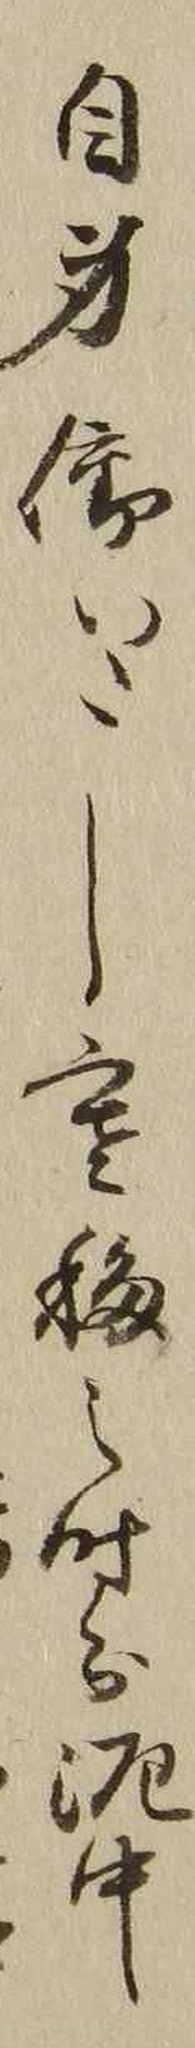自身働いたし寒移之時分泥中
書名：諸士系譜　巻之225　ま之部6
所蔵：会津若松市立会津図書館
